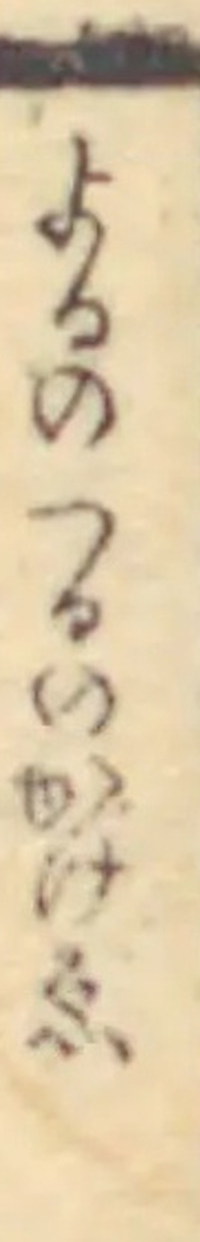よるのつるのかけゑ
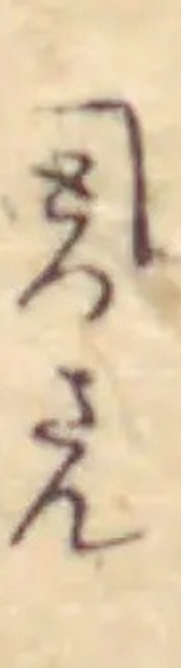乁とつさん
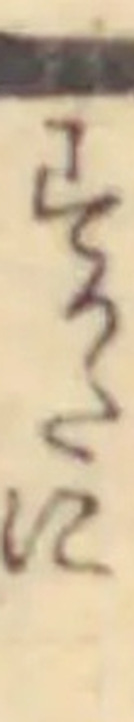すがたに
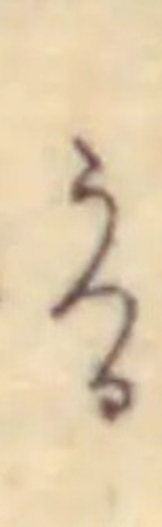うつる
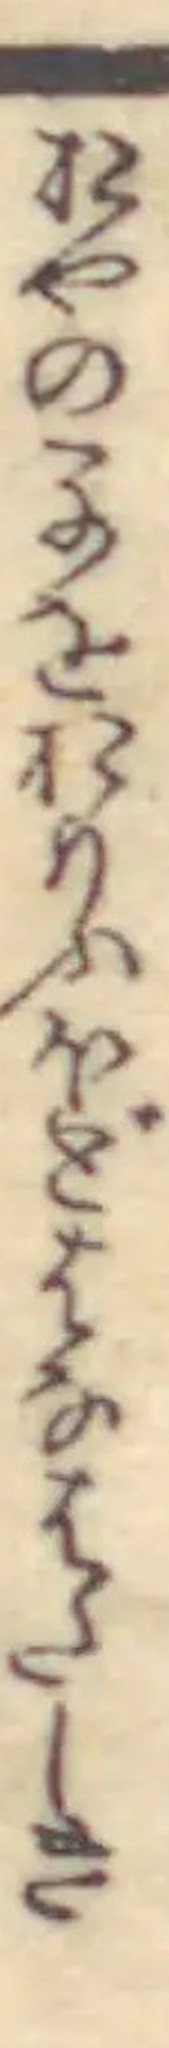おやの子を思ふほどはなはたしき
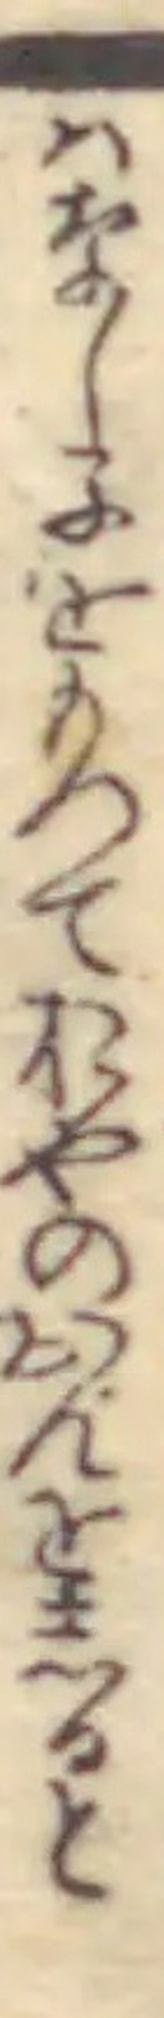はなし子をもつておやのおんをしると
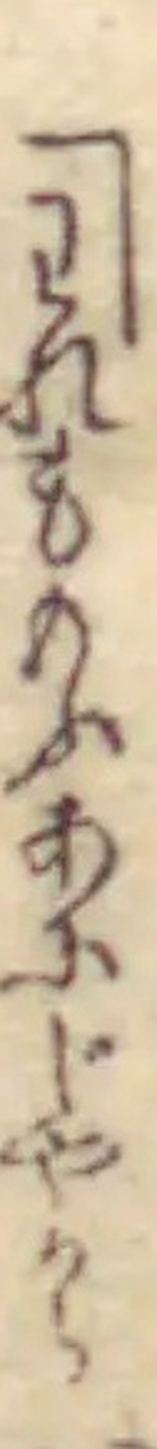乁われももふあにじやから
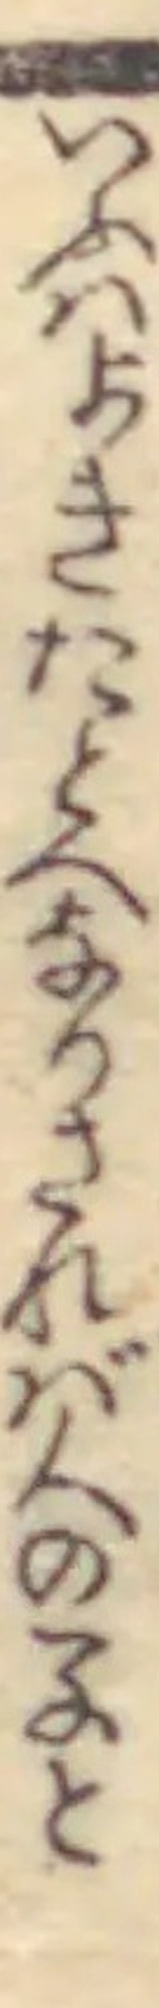いふはよきたとへなりされば人の子と
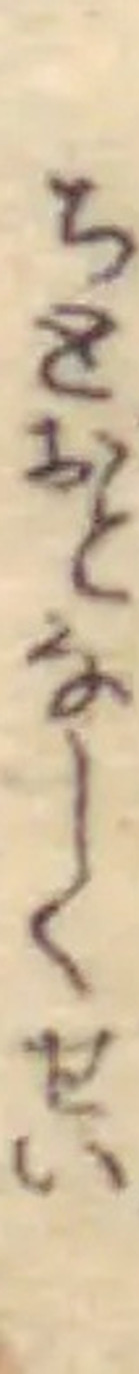ちとおとなしくせい
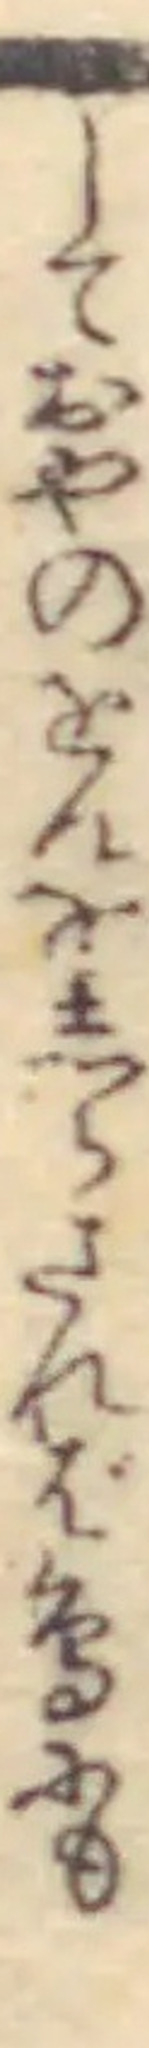しておやのをんをしらされば鳥にも
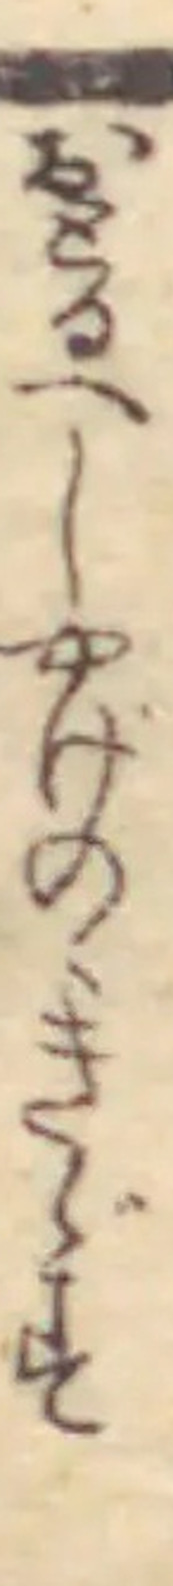おとるへしやけのゝきゞす
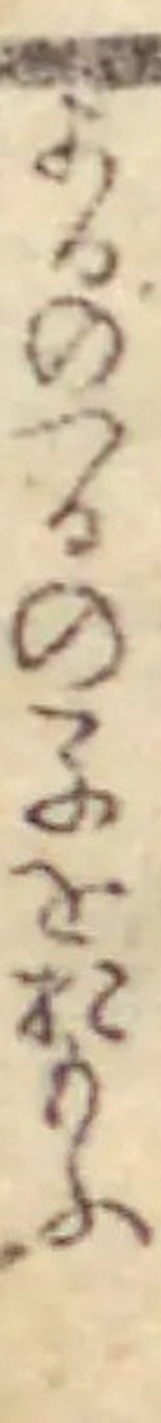よるのつるの子をおもふ
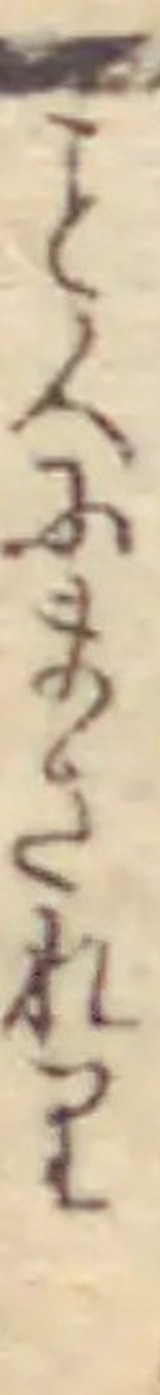こと人にまされり
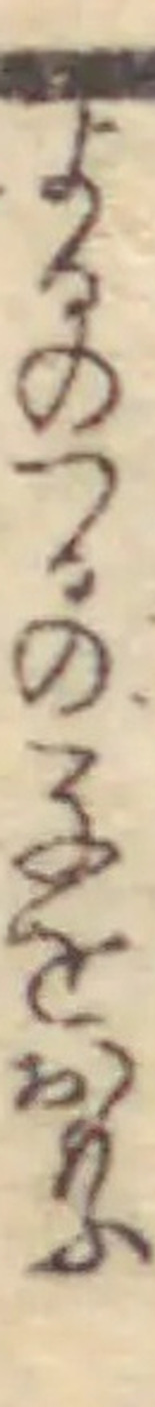よるのつるの子をおもふ
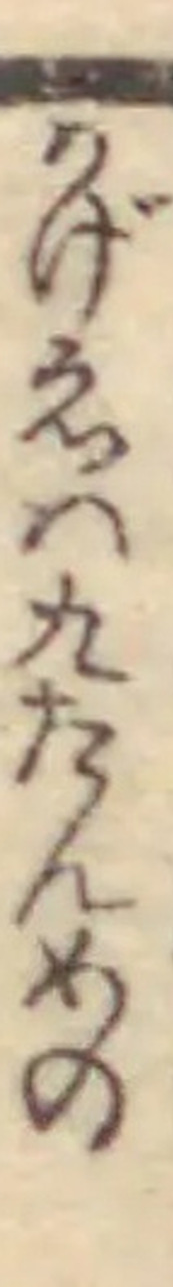かげゑは九たんめの
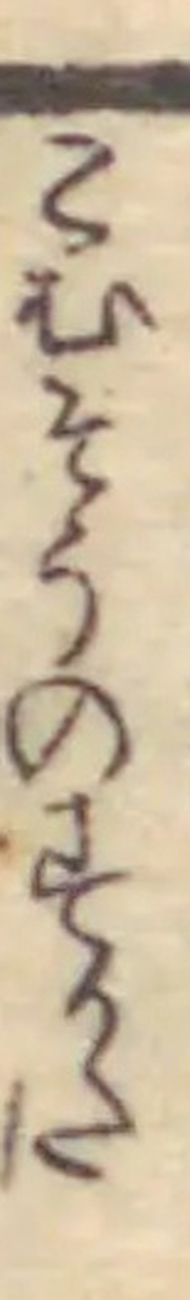こむそうのすかた
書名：児訓影絵喩 3巻
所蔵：国立国会図書館 National Diet Library, JAPAN
